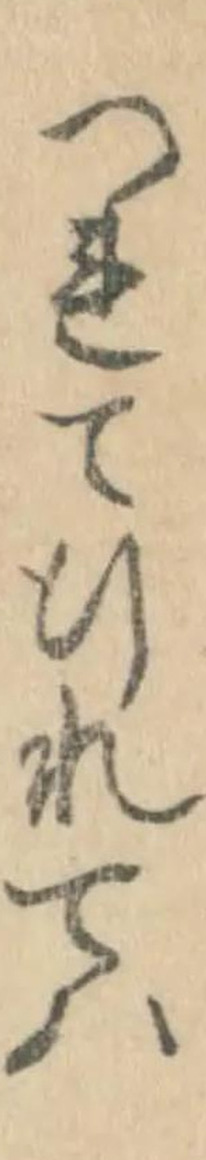つれて行れては
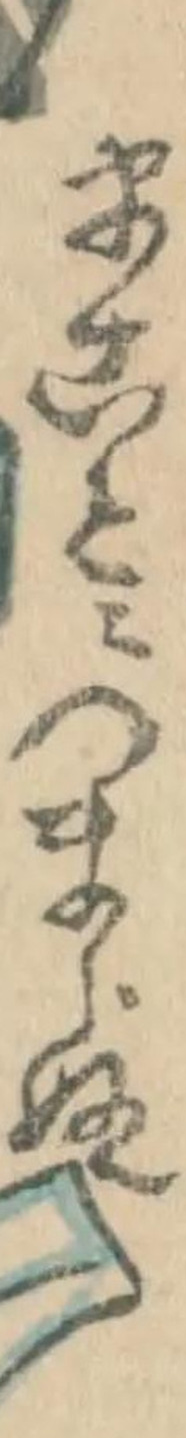まことにつまらぬ

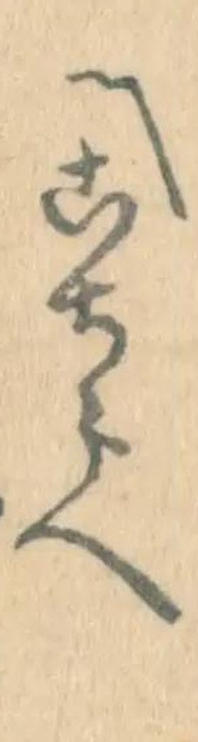〽こちらへ
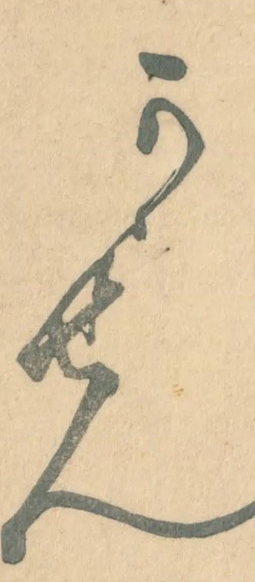かせん
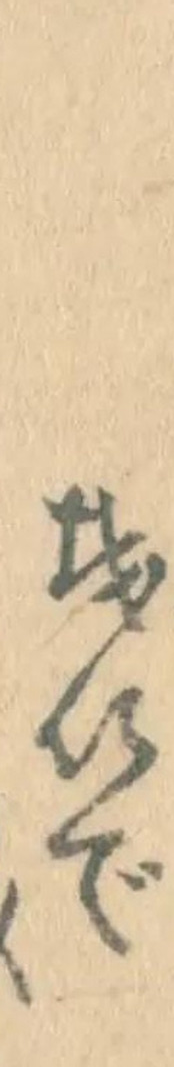おいで
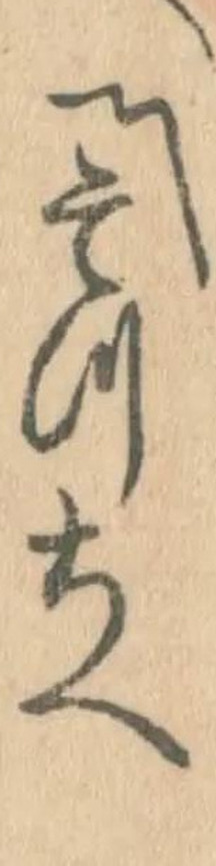〽そつちへ
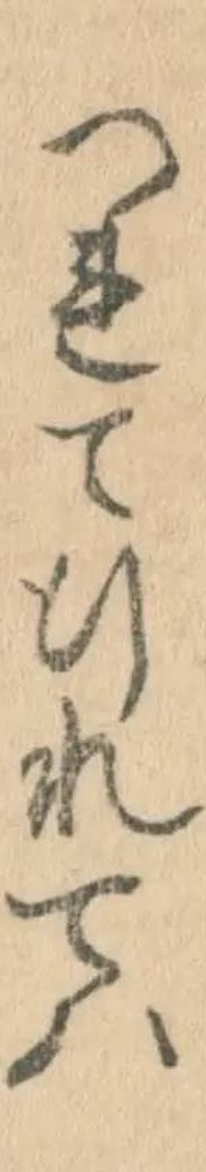つれて行れては
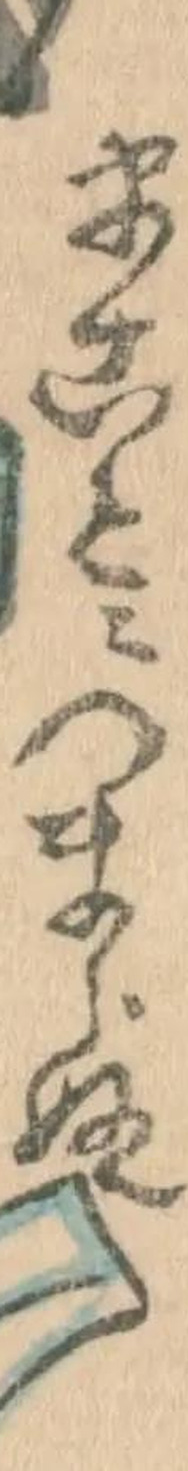まことにつまらぬ
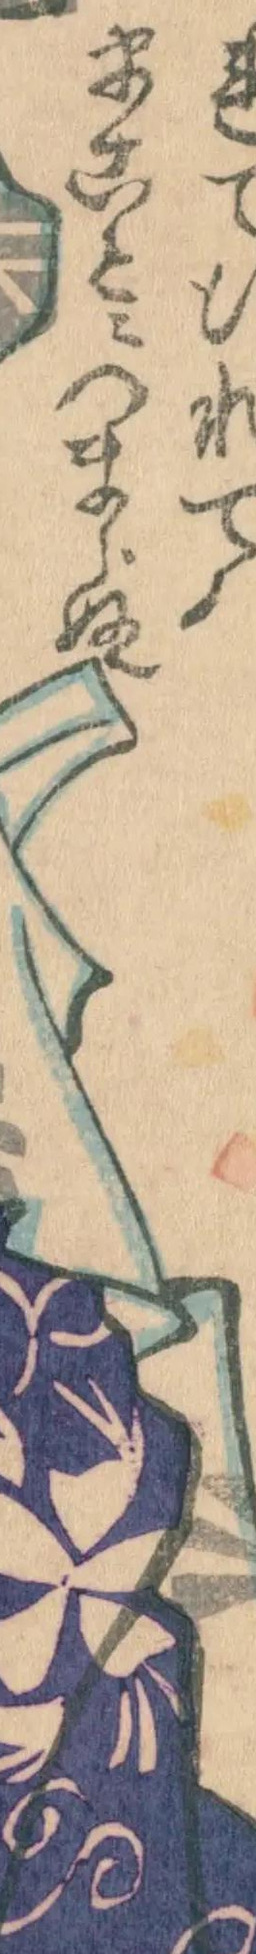まことにつまらぬ
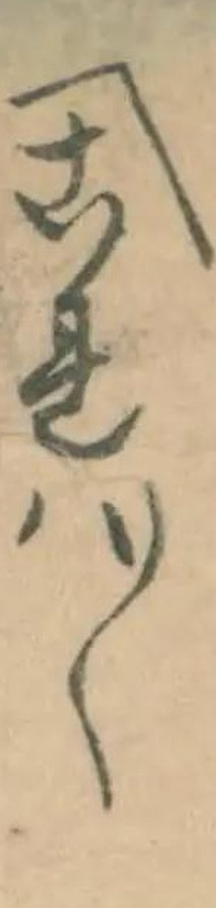〽これは〳〵
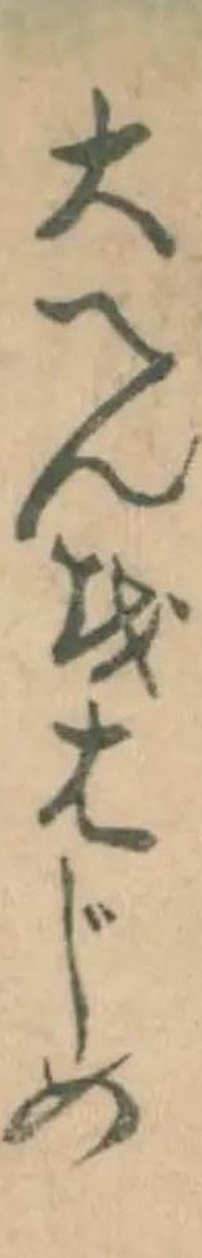大へんをはじめ
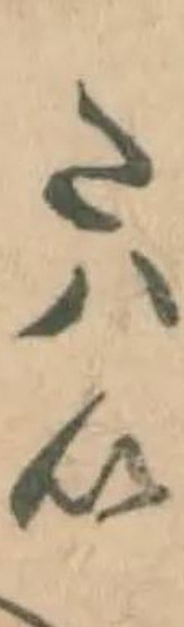たはい
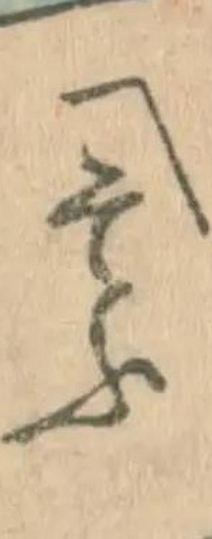〽そふ
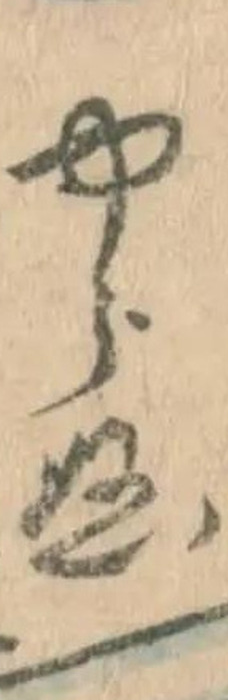やらぬ

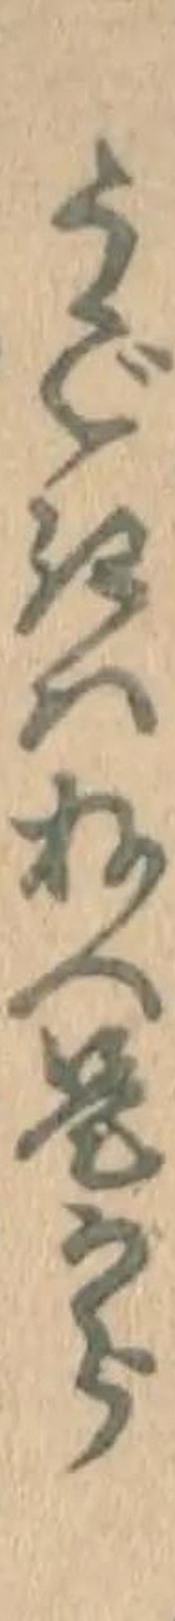うごきはねへ是から
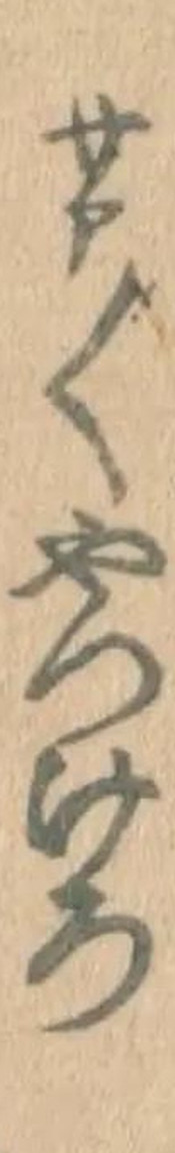サァ〳〵やつけろ
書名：国芳国貞錦絵
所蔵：国立国会図書館 National Diet Library, JAPAN
